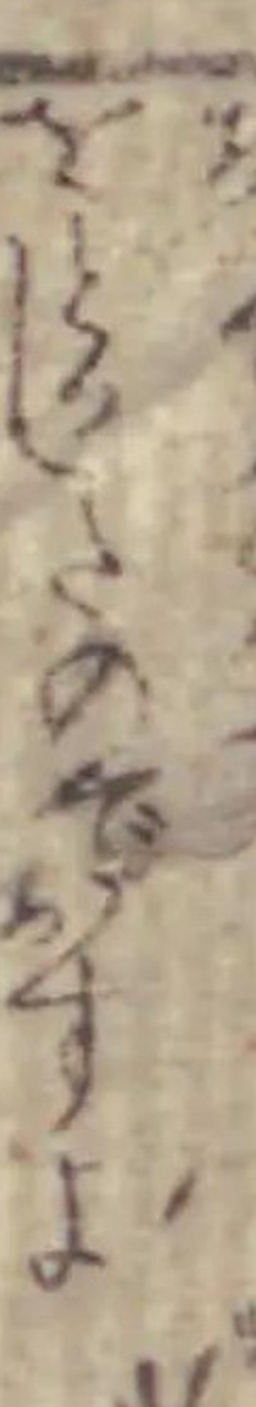をどかしたのでおすよ
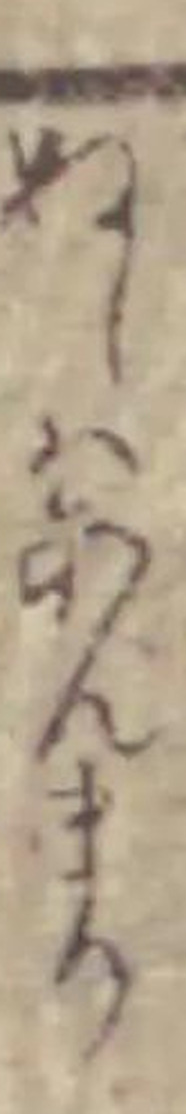ぬしはあんまり
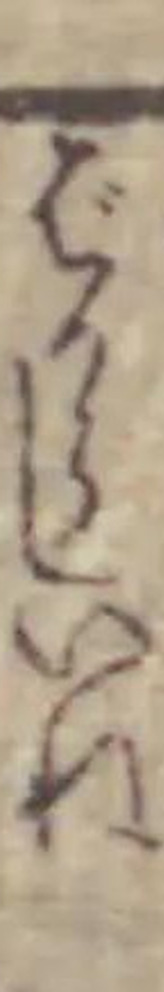ばからしいね
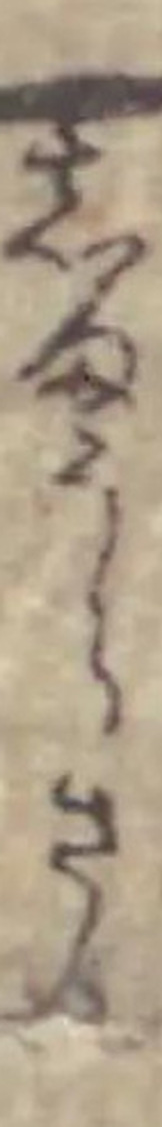しまうらさん
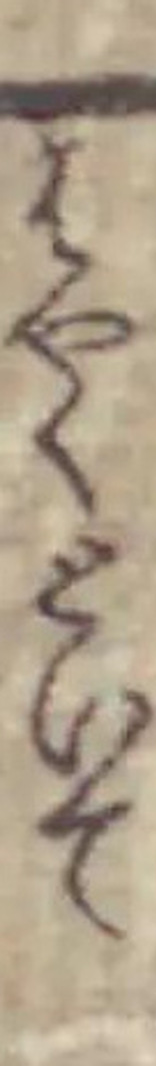はやくといて
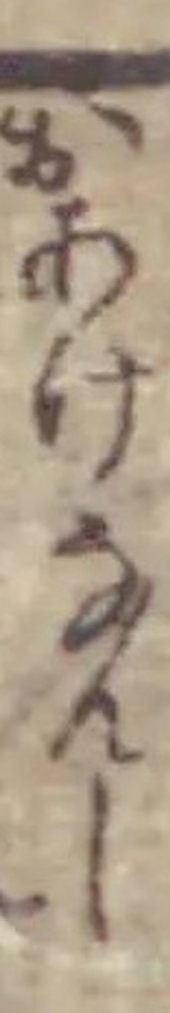おあけなんし
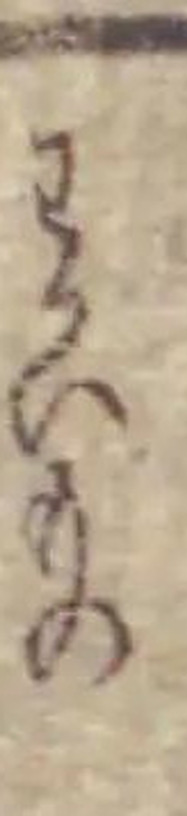わかいもの
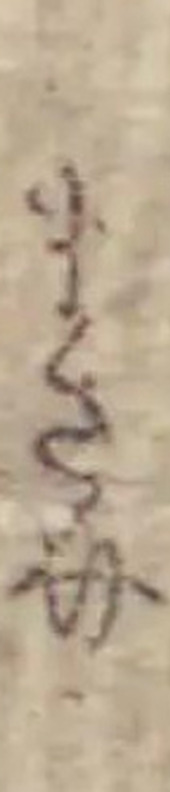まさ介
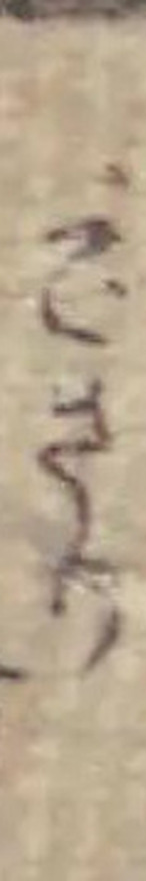ごさり

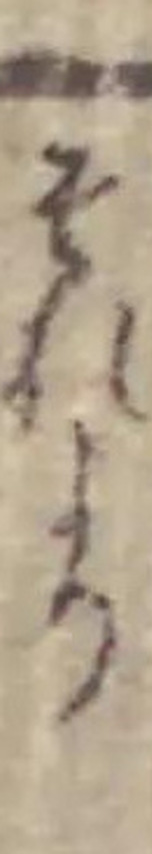それより
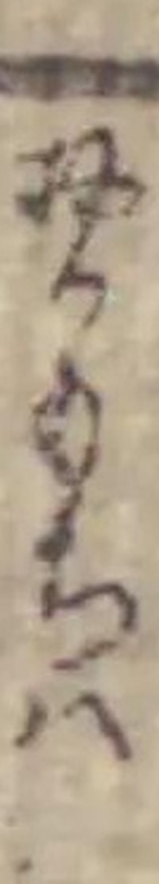おかもちは
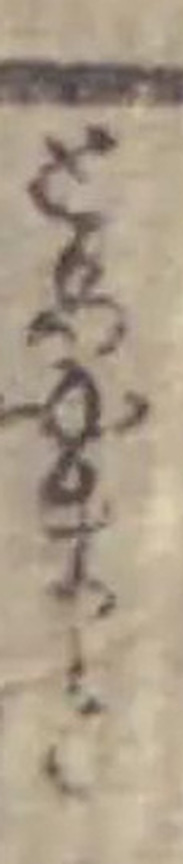とめやまと
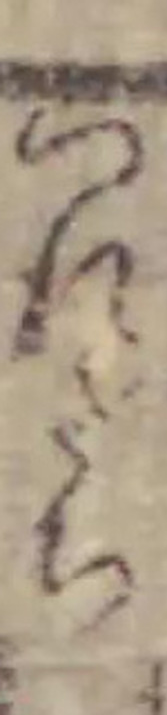つれだち
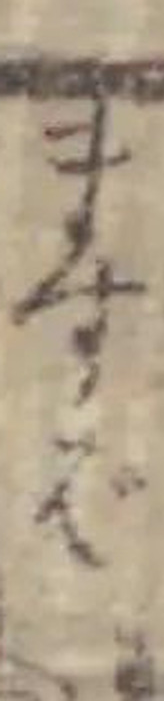ますば
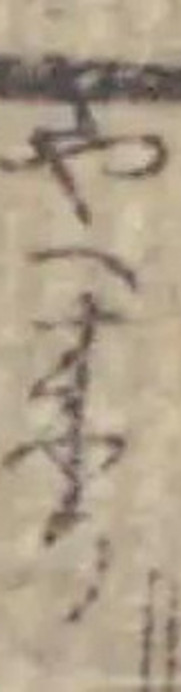やへ来り
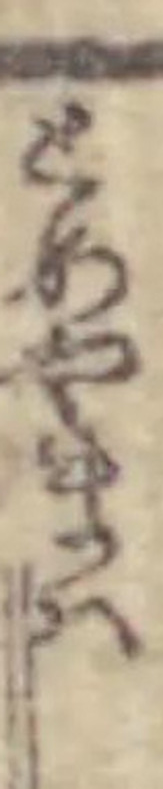とめやまは
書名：亀山人家妖 3巻
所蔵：国立国会図書館 National Diet Library, JAPAN
